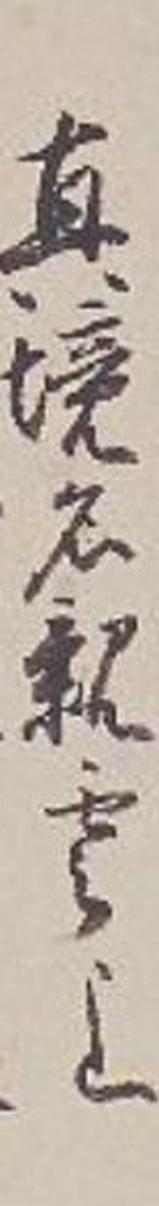同真境名親雲上
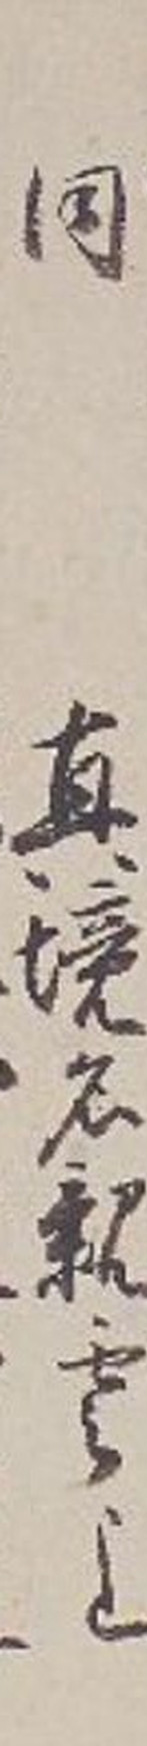同真境名親雲上
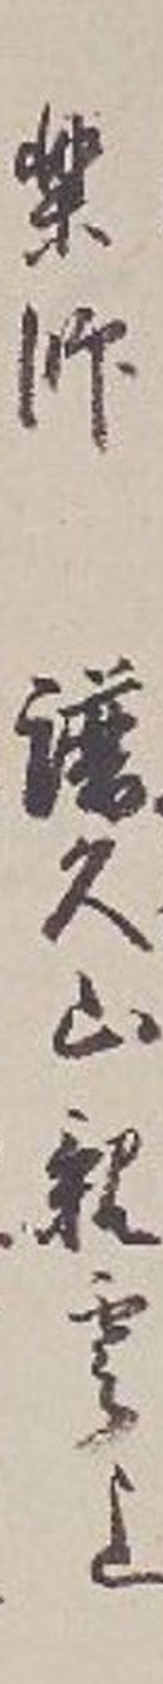楽師譜久山親雲上
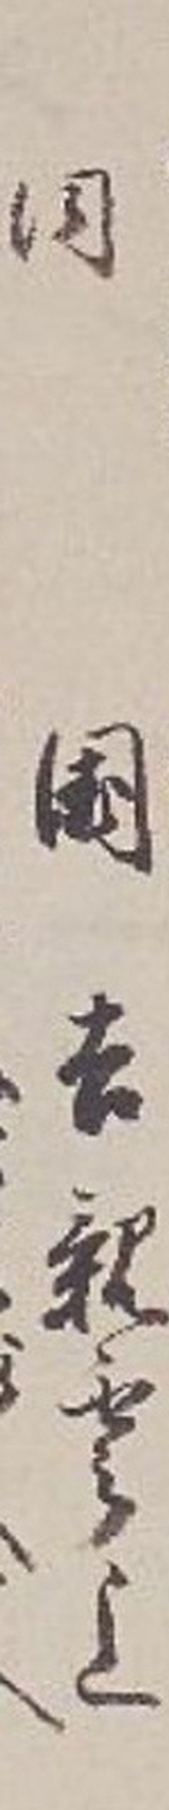同国吉親雲上
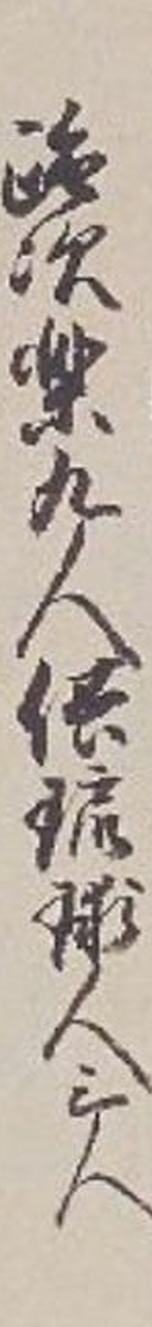路次楽九人供琉球人三人
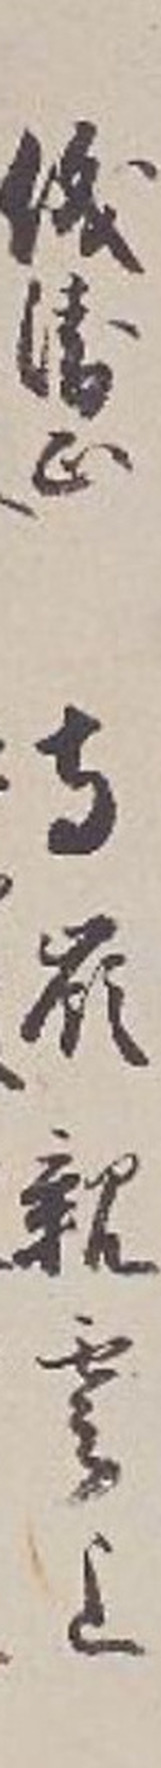儀衛正寺嶺親雲上
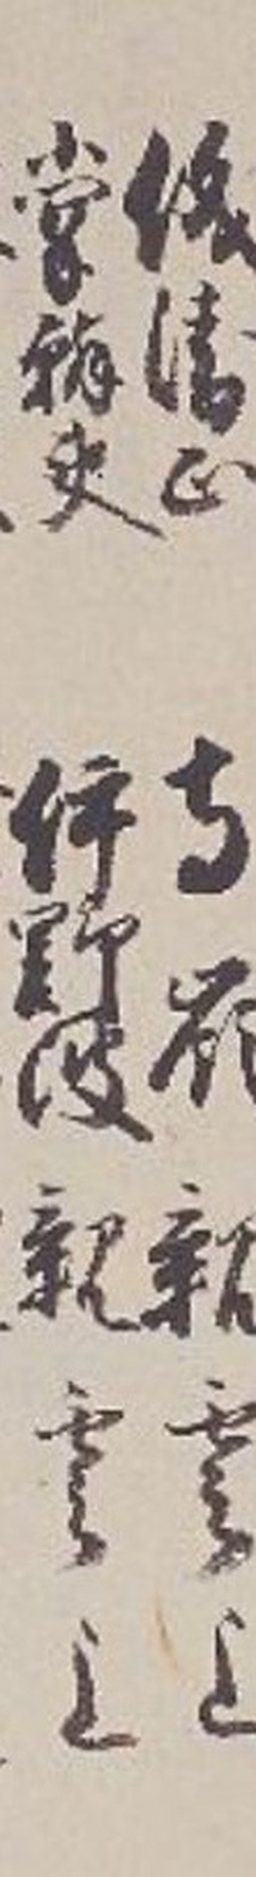掌翰吏伊野波親雲上
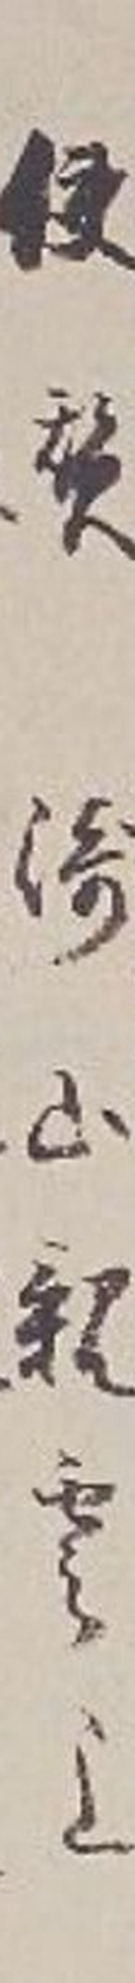使賛崎山親雲上
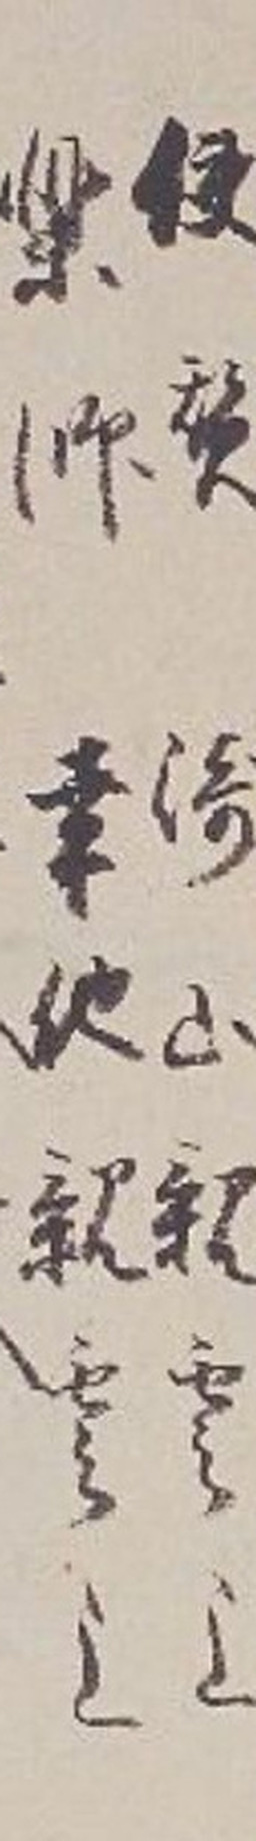楽師幸他親雲上
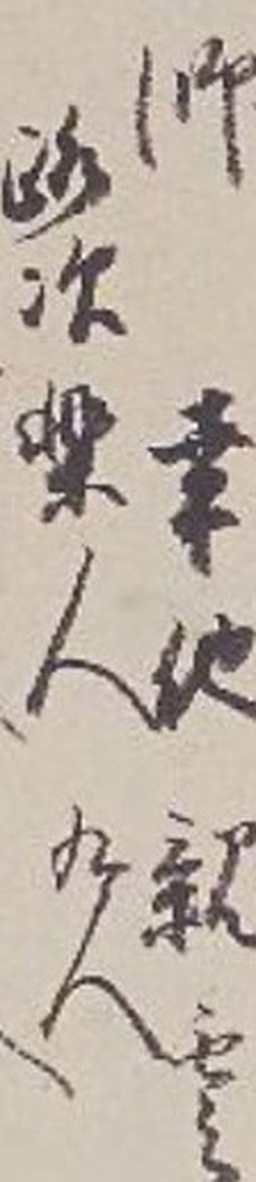路次楽人九人
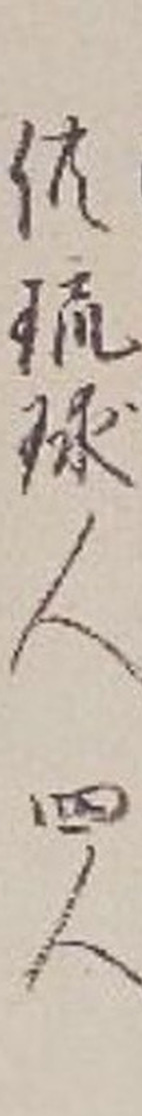供琉球人四人

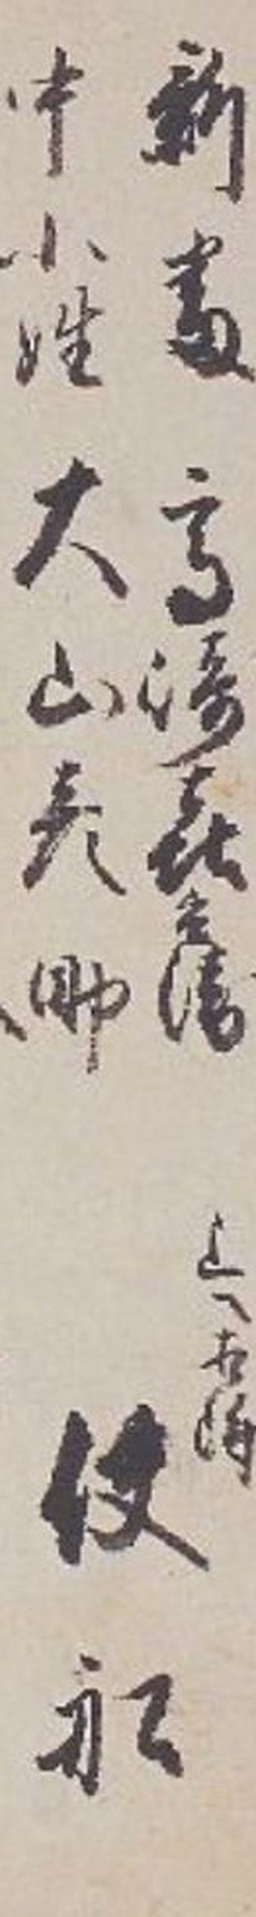中小姓大山彦助使船
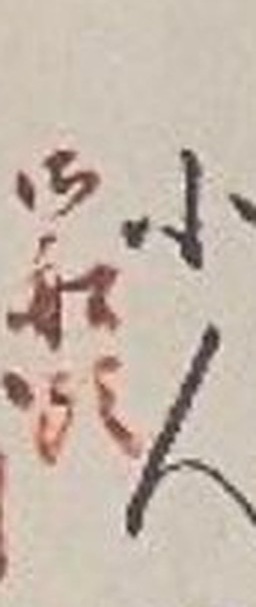御船頭
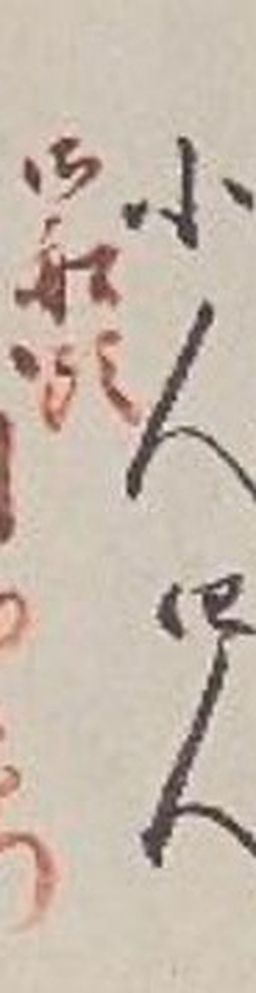御船頭
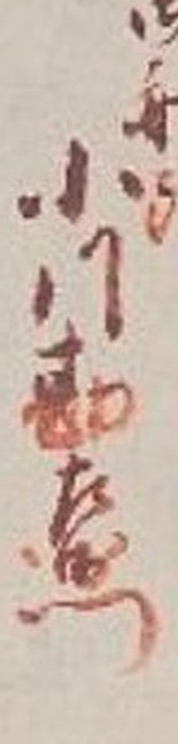小川勘左衛門
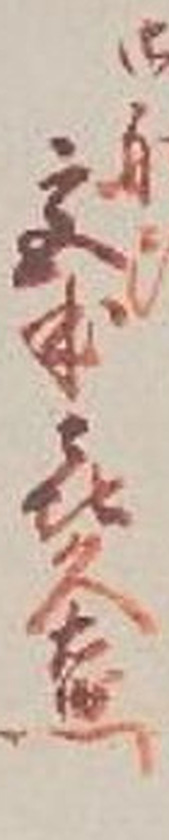宮本喜久右衛門
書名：琉球人就来府淀川筋船行列帳 但木津川より大阪御屋敷迄並其外一巻
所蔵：University of the Ryukyus Library
